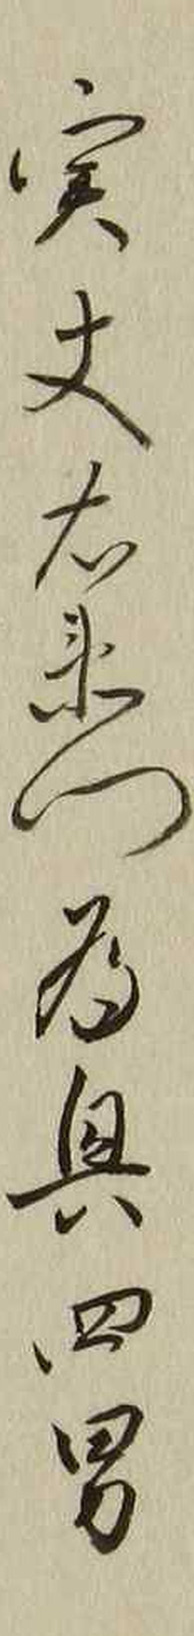実丈右衛門為興四男
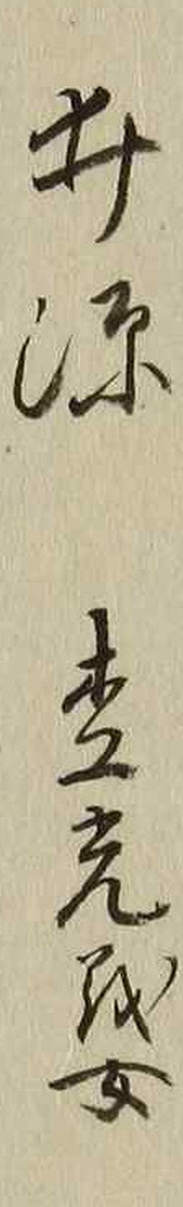井深杢光義女
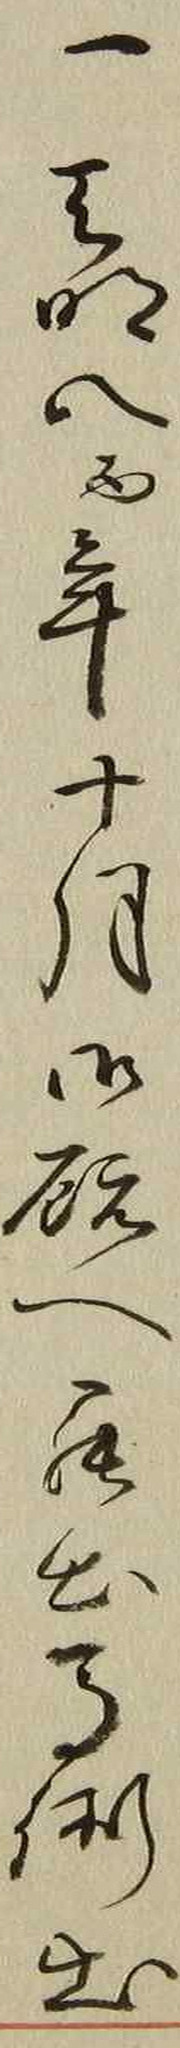一天明八酉年十月御厩へ罷出馬術出
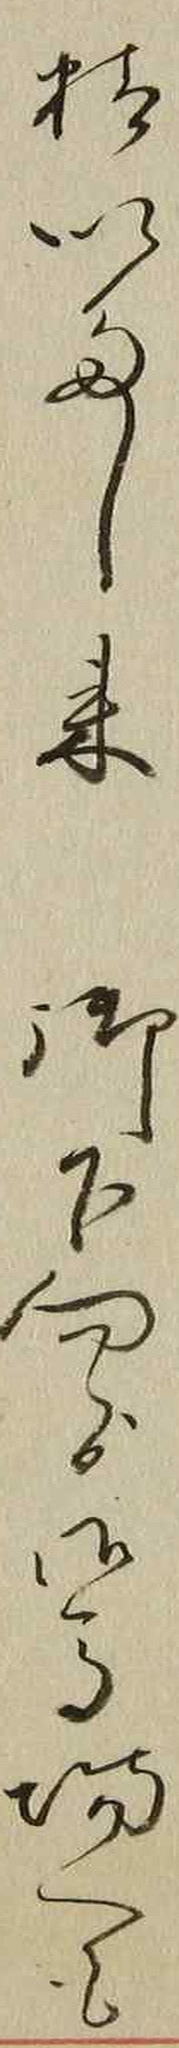精いたし来御下向ゟ御馬場へも
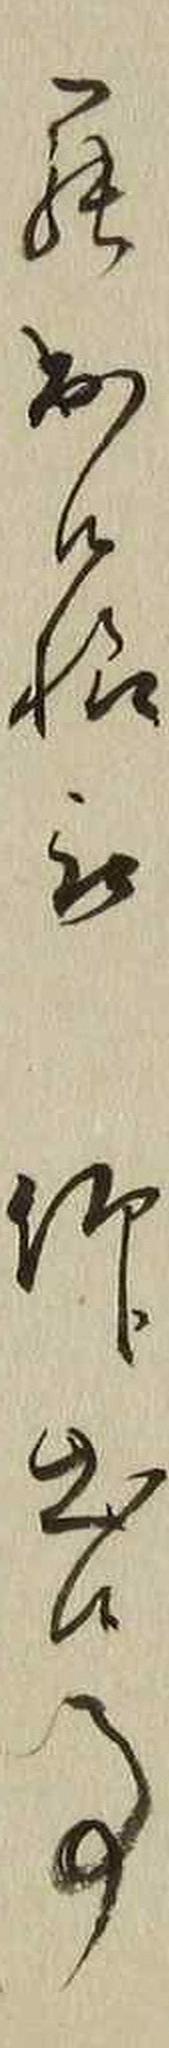罷出候様被仰出候事
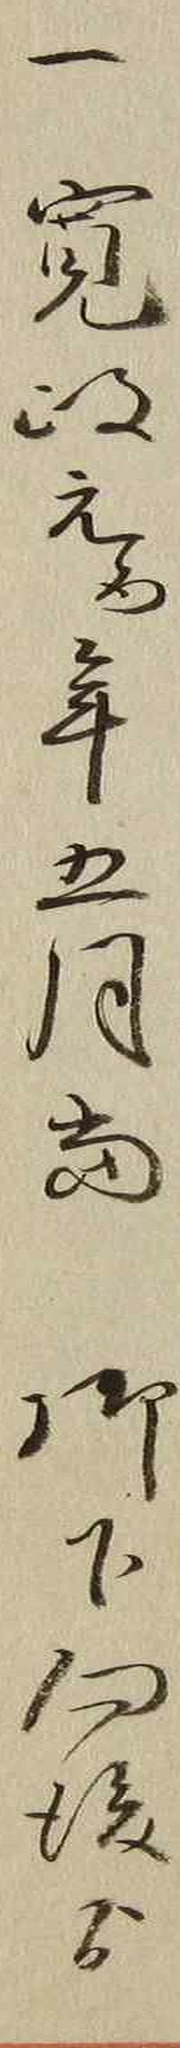一寛政元酉年五月当御下向後ゟ
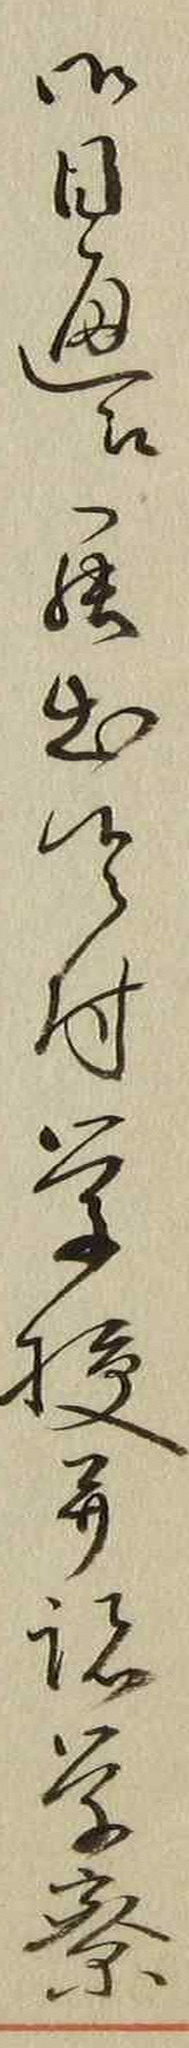御目通江罷出候に付学校并諸学寮
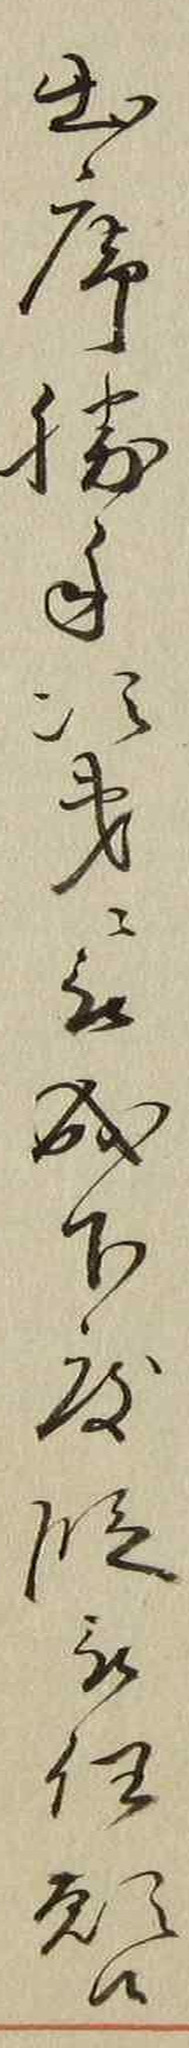出席勝手次第に被成下度段被任願候
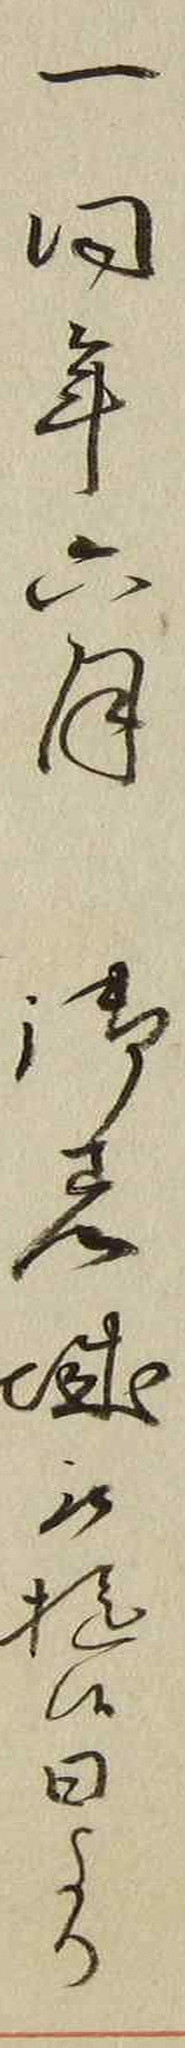一同年六月御着城被遊候日より
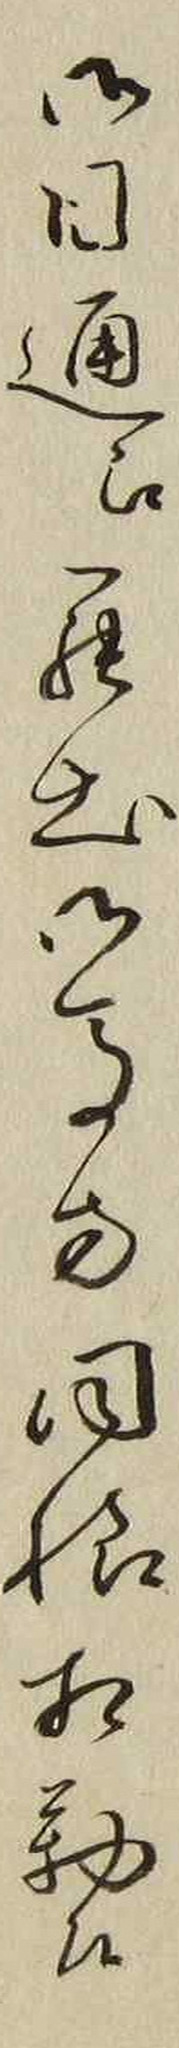御目通江罷出御馬方同様勤候
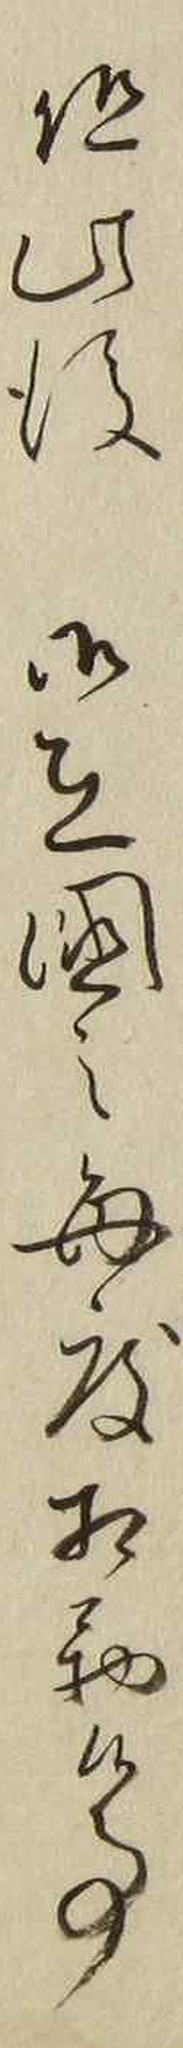但此後御在国之毎度相勤候事

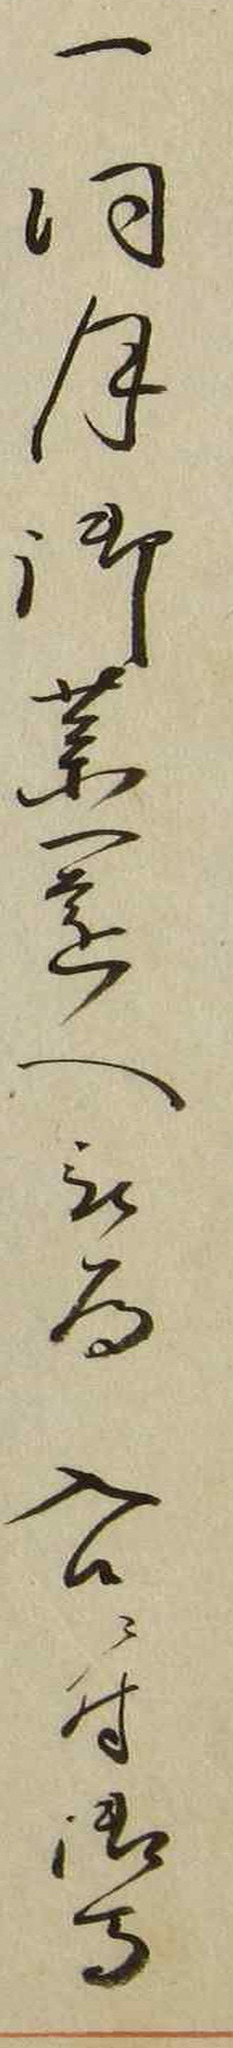一同月御薬園へ被為入候に付御馬
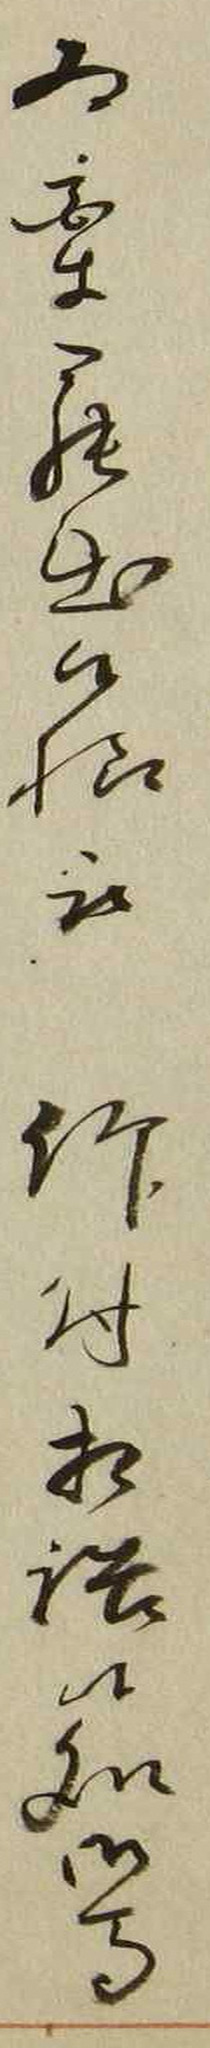為牽罷出候様被仰付相詰候処御馬
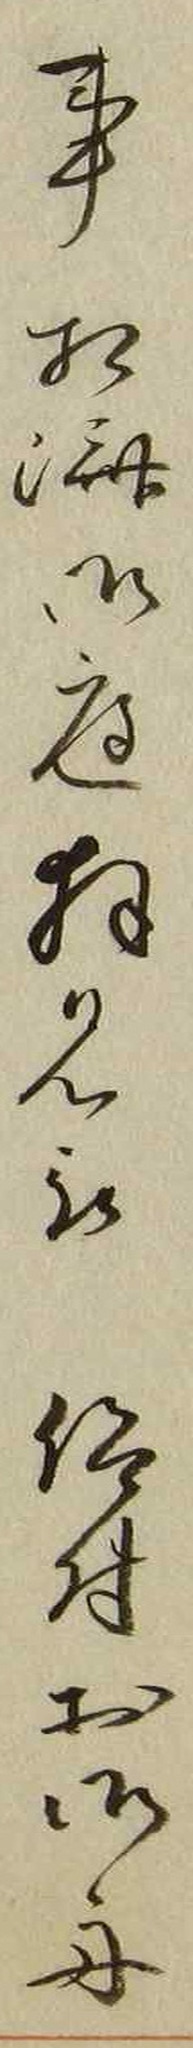事相済御庭拝見被仰付於御舟
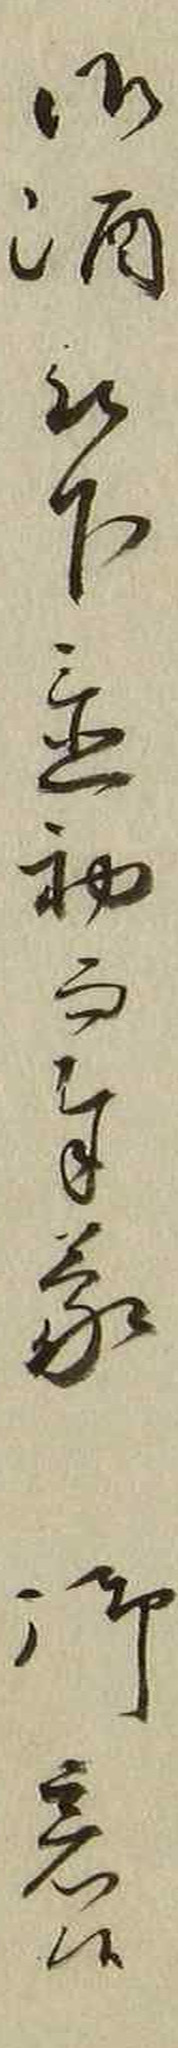御酒被下置初而奉蒙御意候
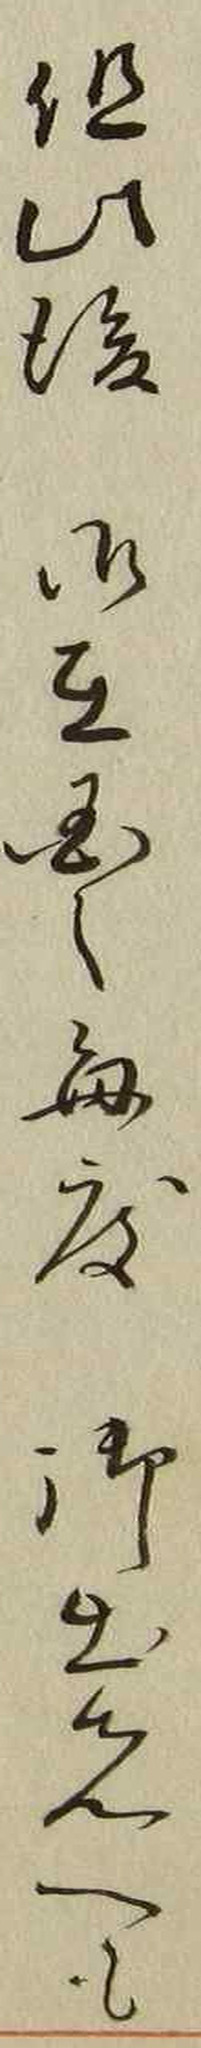但此後御在国之毎度御出先へも
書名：諸士系譜　巻之3　い之部3
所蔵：会津若松市立会津図書館
